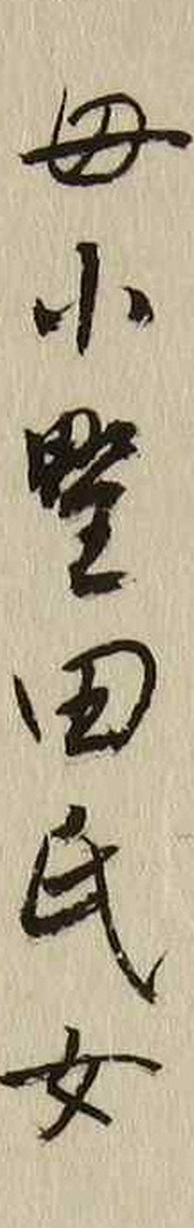母小野田氏女
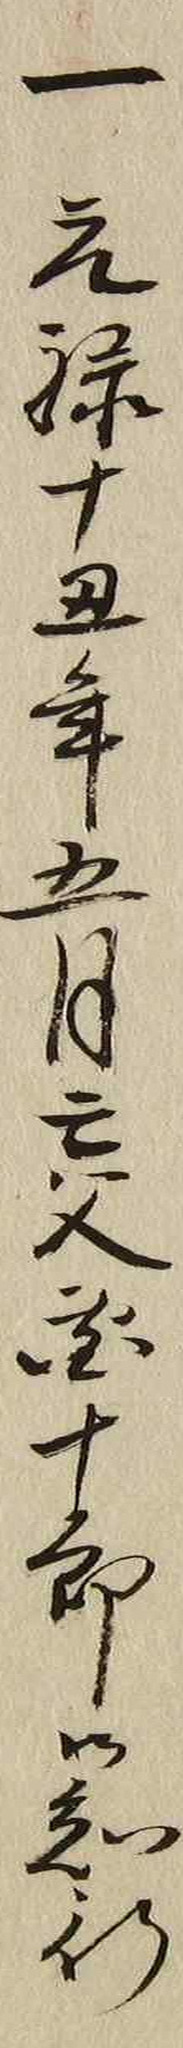一元禄十丑年五月亡父団十郎御知行
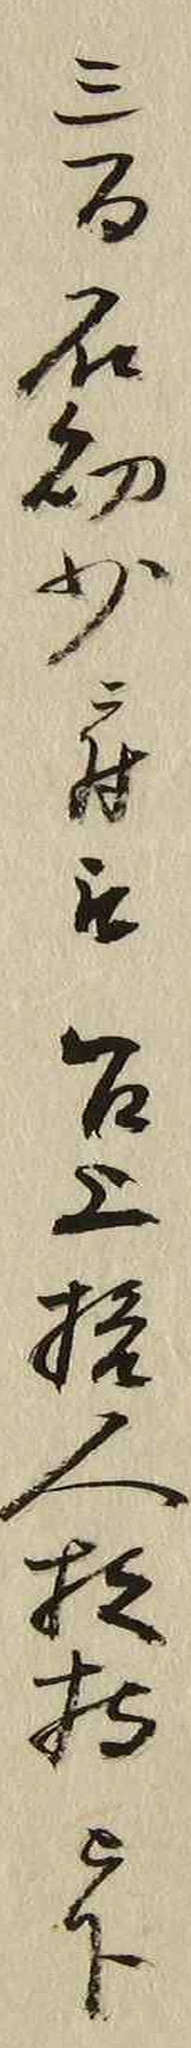三百石幼少ニ付被召上拾人扶持被下
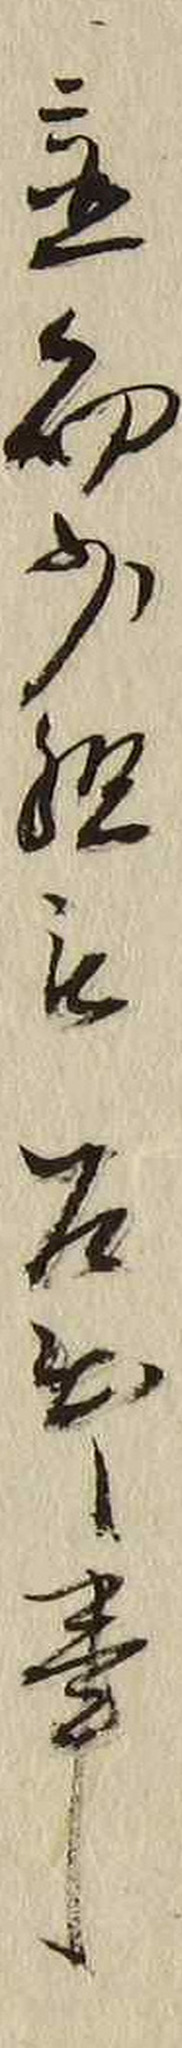置幼少組被召出候事
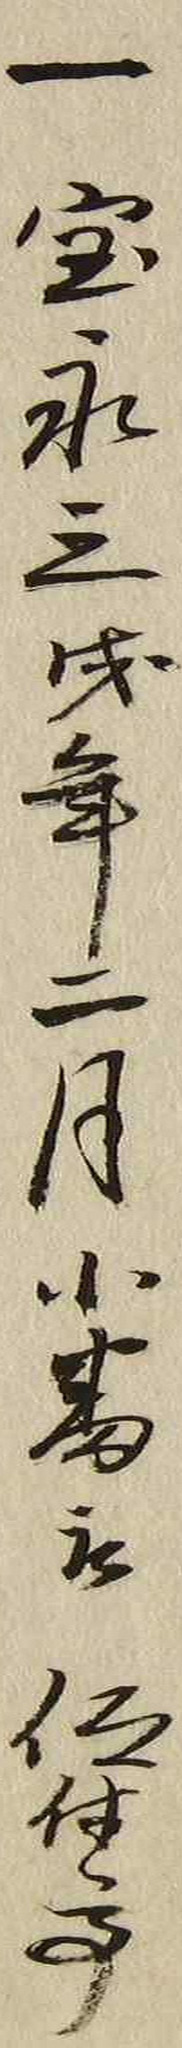一宝永三戌年二月小番被仰付候事
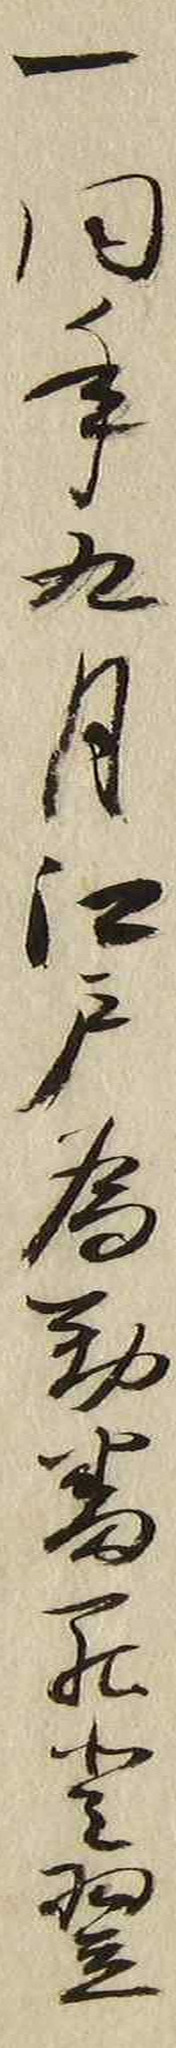一同年九月江戸為勤番罷登翌
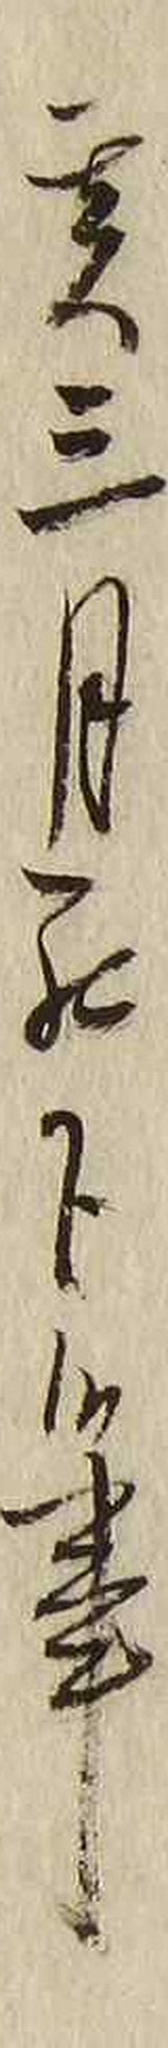亥三月罷下候事

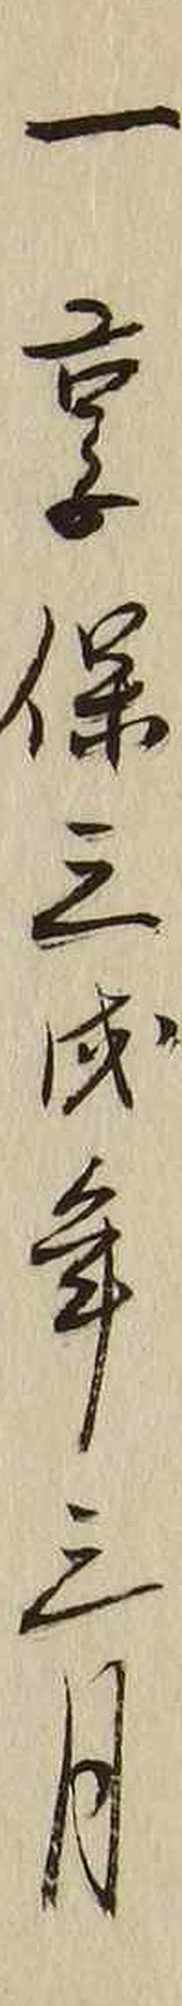一享保三戌年三月
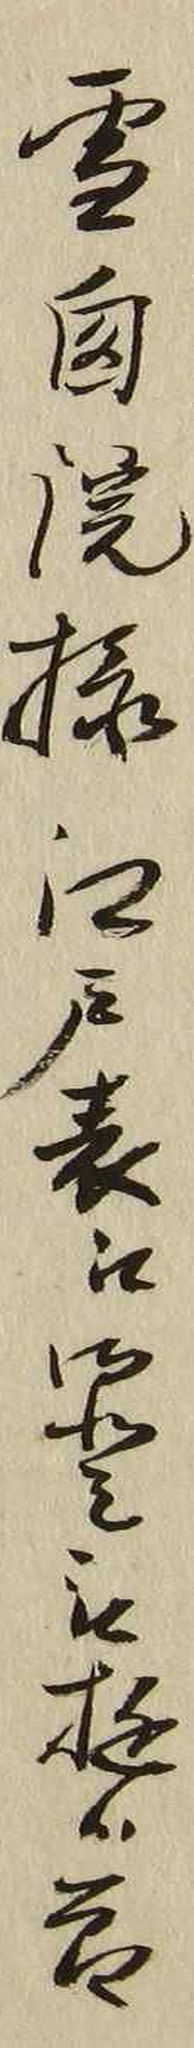雪囱院様江戸表江御登被遊候節
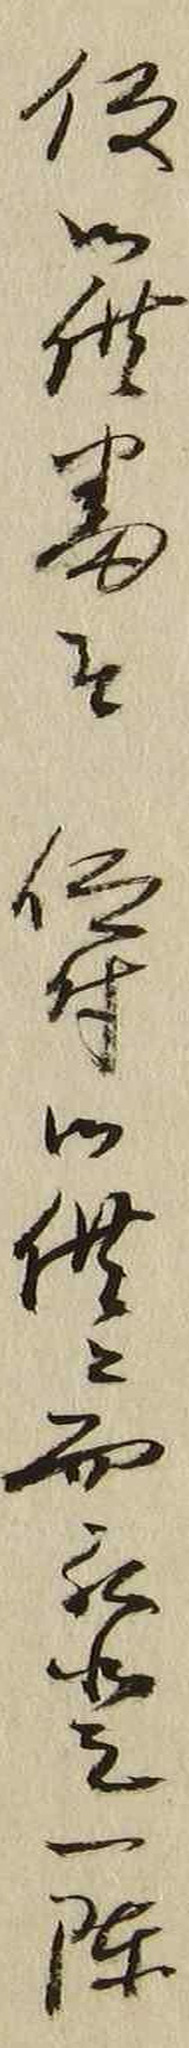仮御供番被仰付御供ニ而罷登一陣
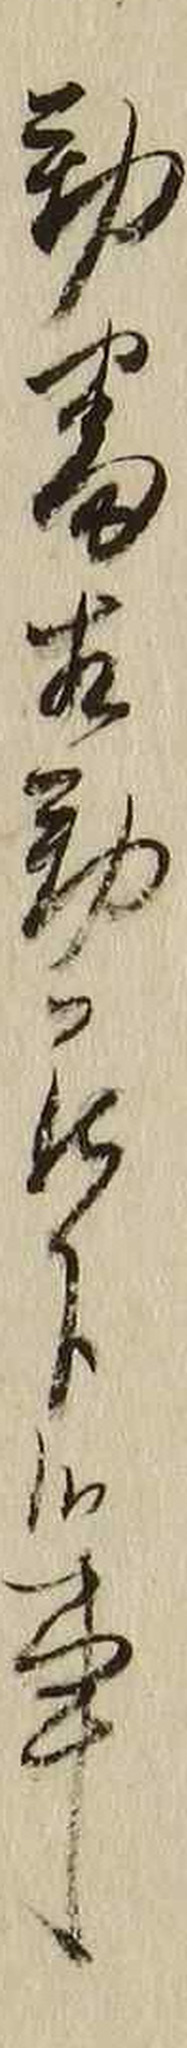勤番相勤罷下候事
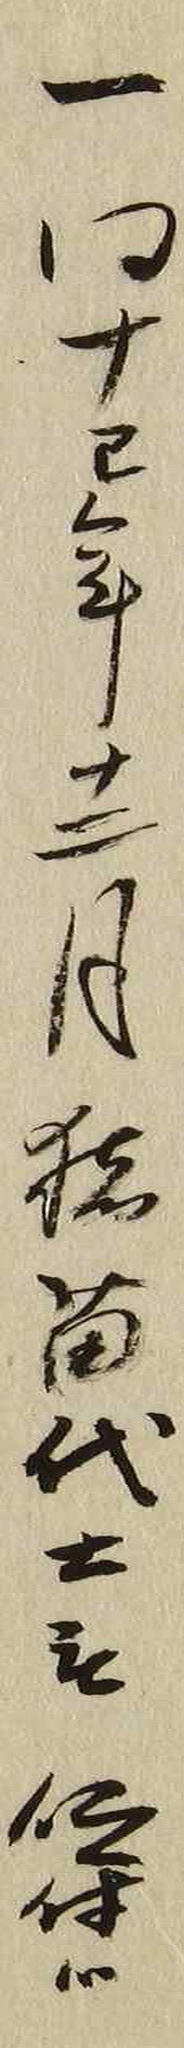一同十巳年十二月猪苗代士被仰付候
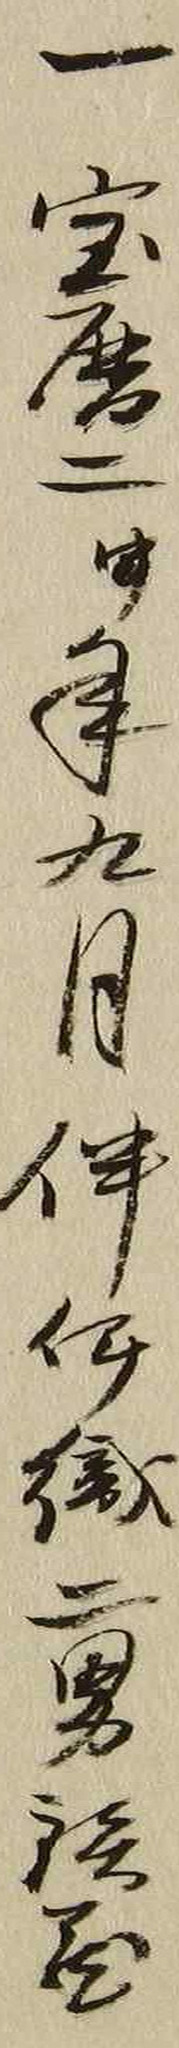一宝暦二申年九月伴伊織二男鉄蔵
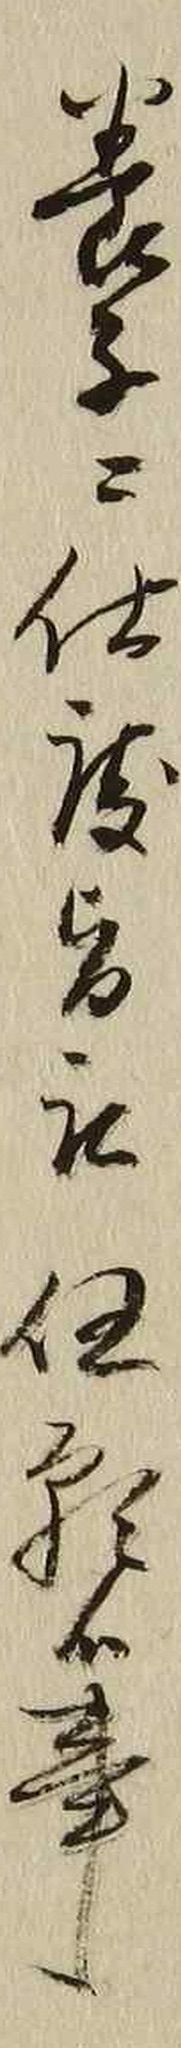養子ニ仕度旨被任願候事
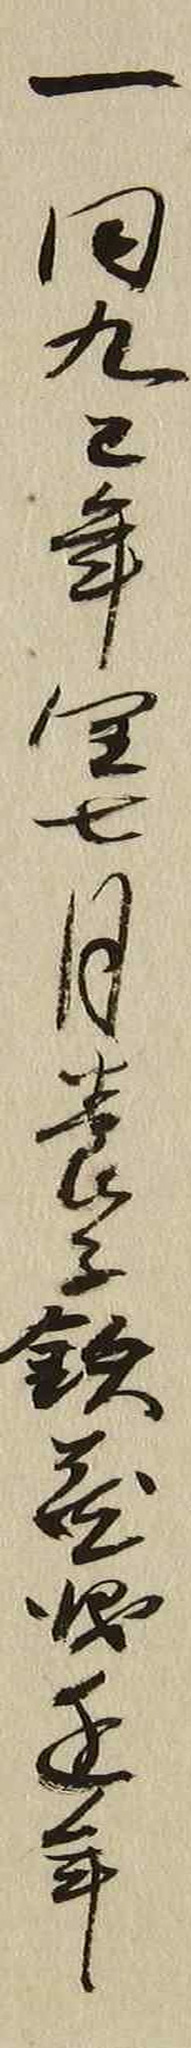一同九巳年閏七月養子鉄蔵儀近年
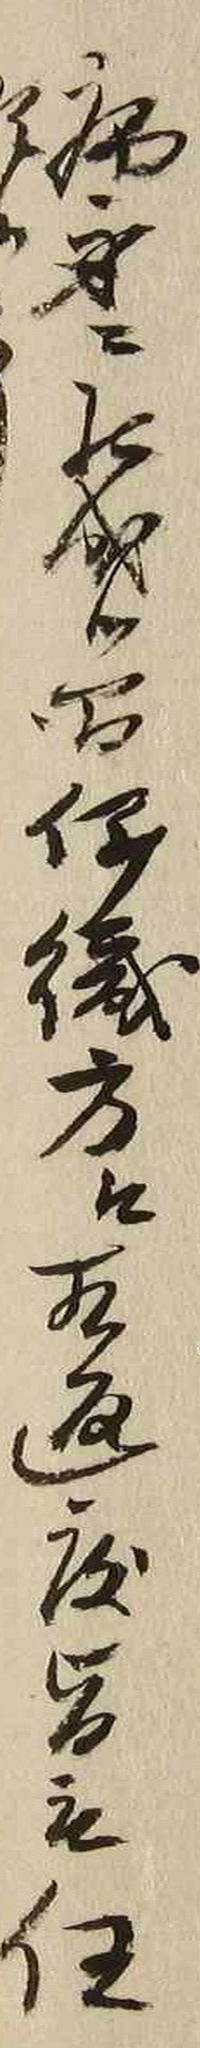病身ニ罷成候間伊織方江相返度旨被任
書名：諸士系譜　巻之345　も之部1
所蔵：会津若松市立会津図書館
